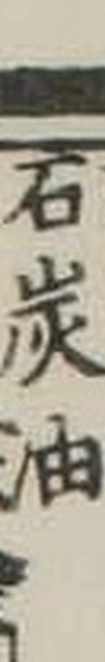石炭油
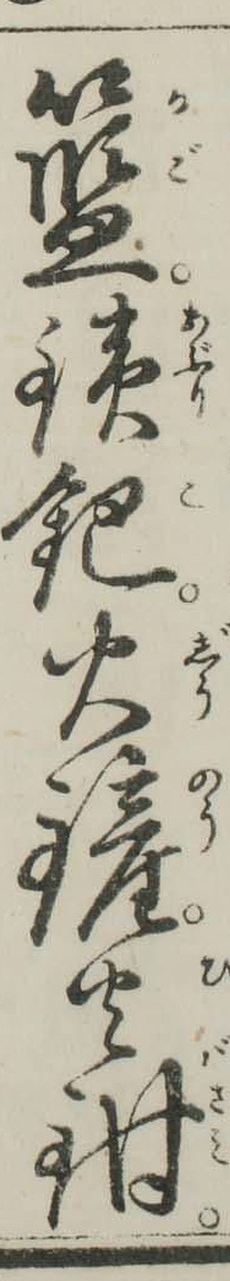籃。鉄鈀。火鏟。火鉗。
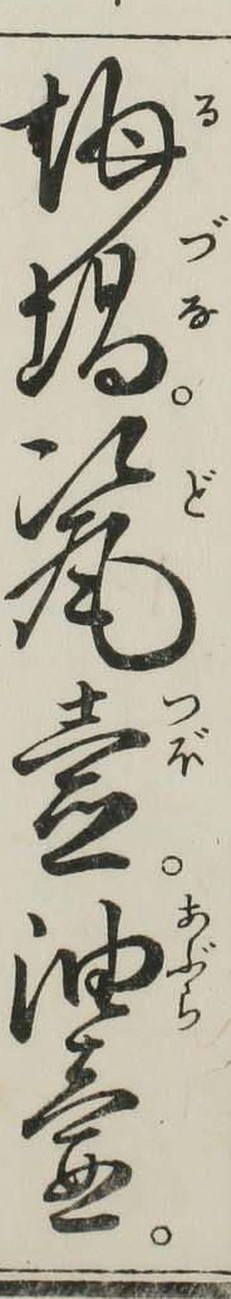坩堝。瓷壺。油壺。
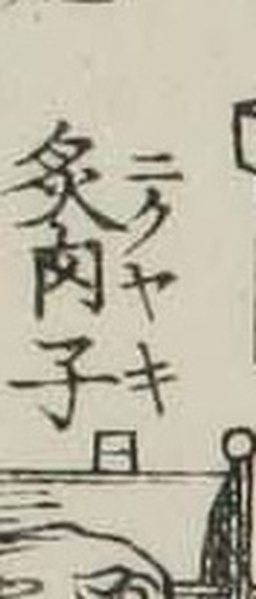炙肉子
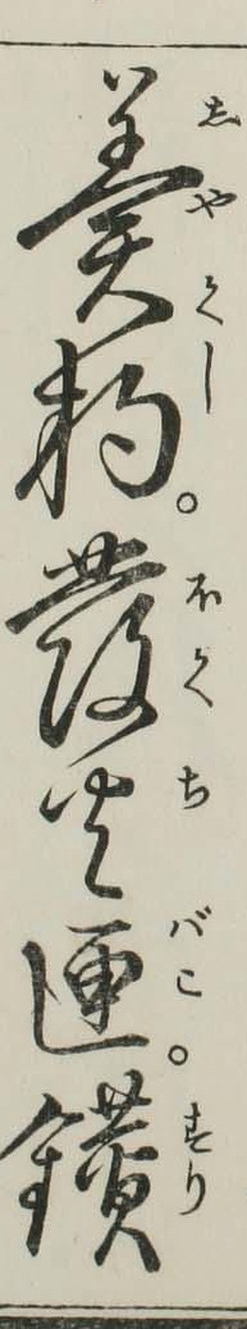羹杓。発火匣。鑚
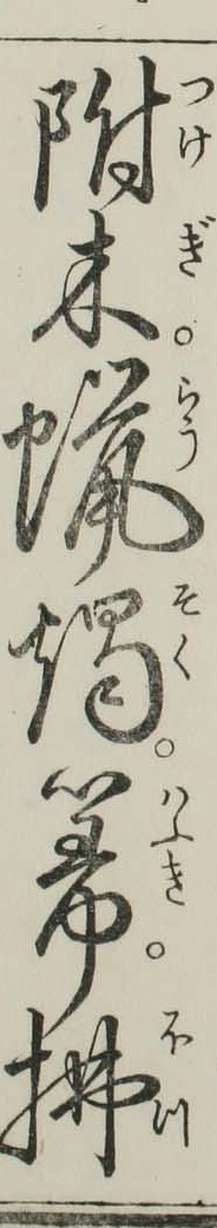附木。蝋燭。箒。払
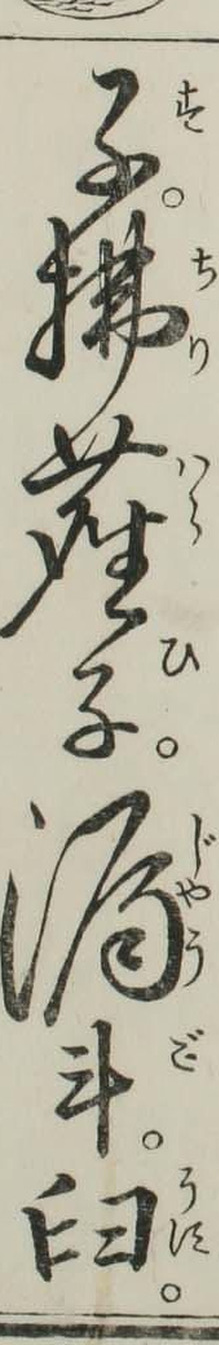子。払塵子。漏斗。臼。

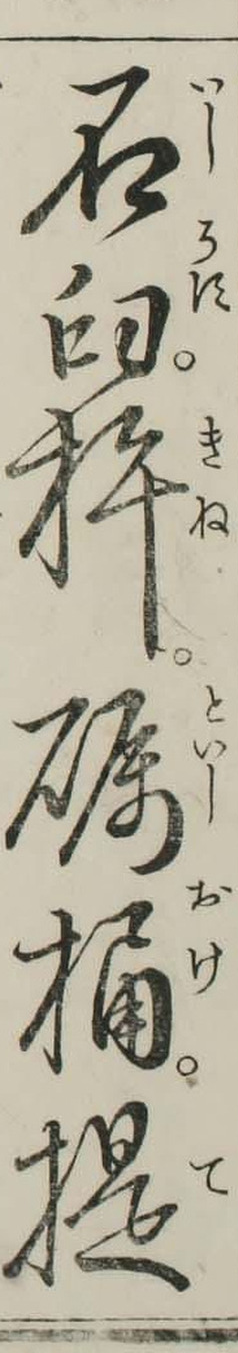石臼。杵。礪桶。提
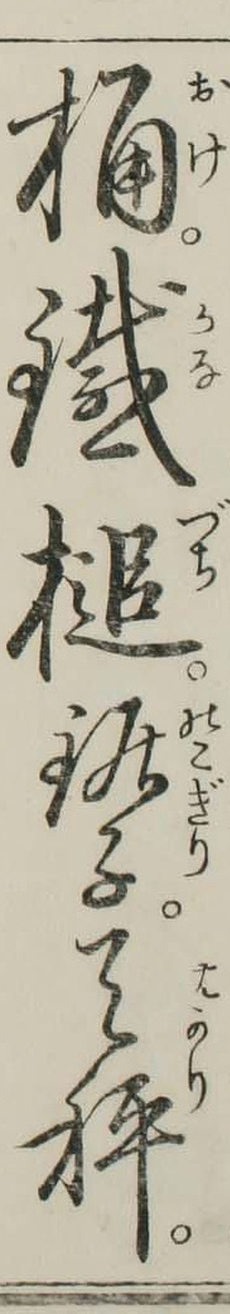桶。鉄槌。鋸子。天秤。
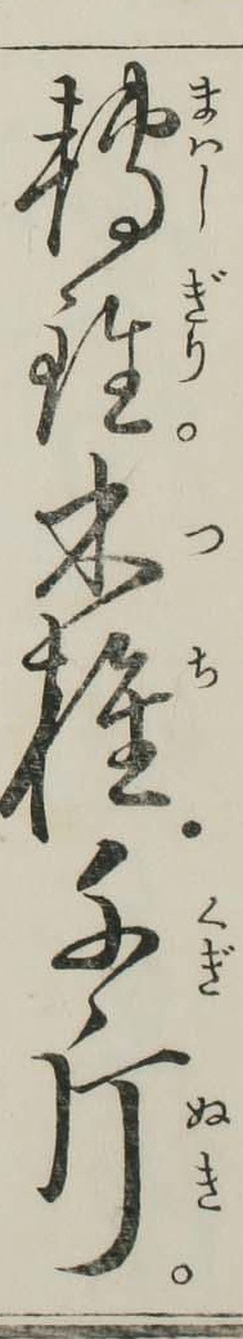転錐。木椎。千斤。
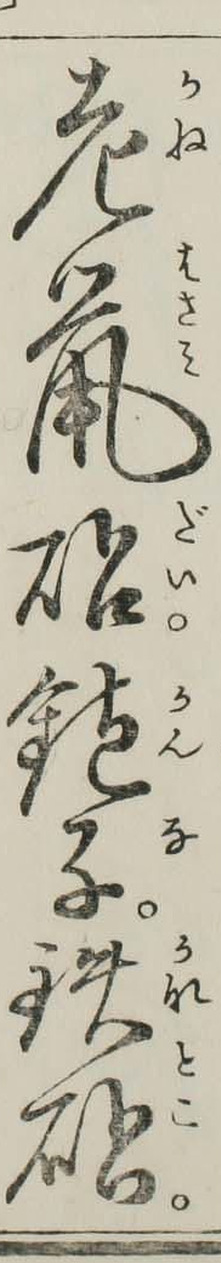老鼠砧。鉋子。銕砧。
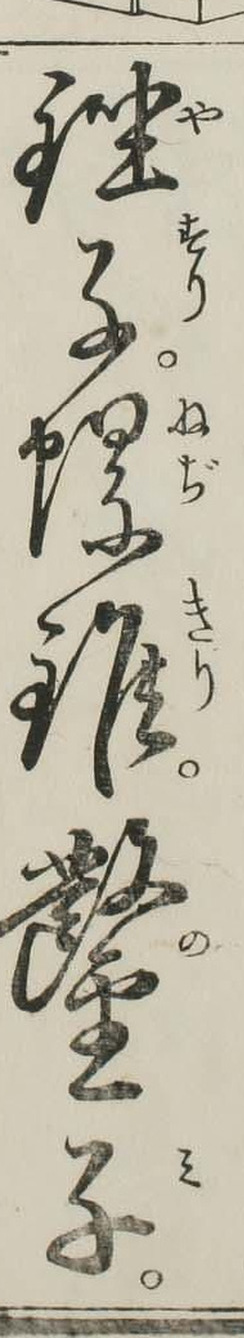銼子。螺錐。鑿子。
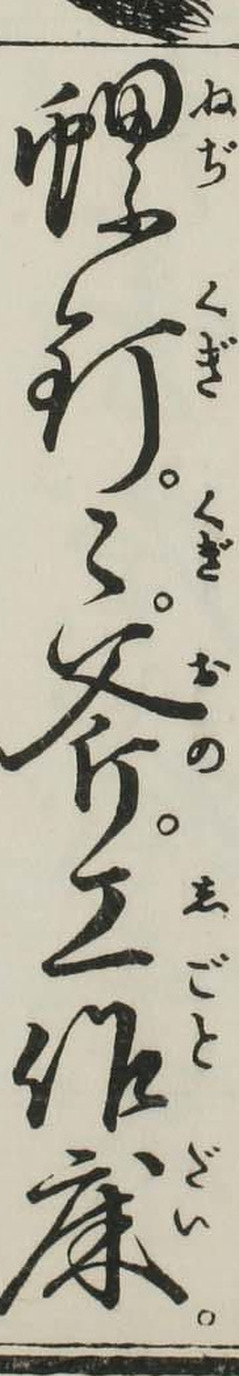螺釘。ゝ。斧。工作床。
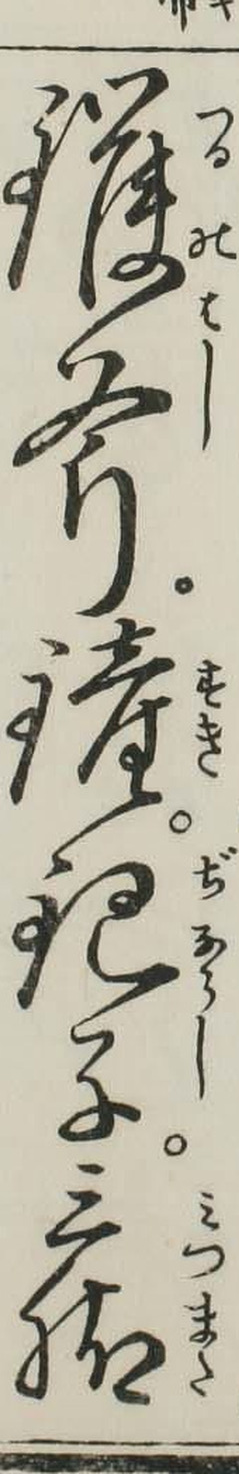钁斧。鏟。鈀子。三脚
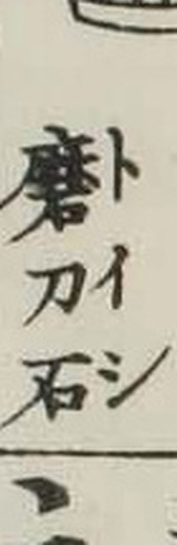磨刀石
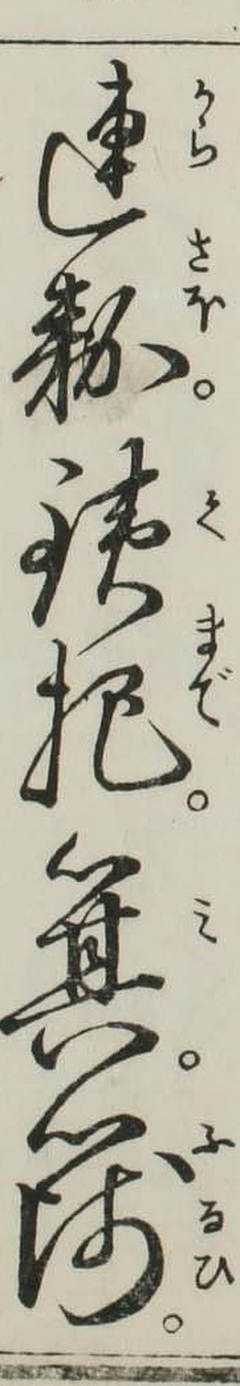連耞。鉄把。箕。篩。
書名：開化往来
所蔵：東京学芸大学教育コンテンツアーカイブ
